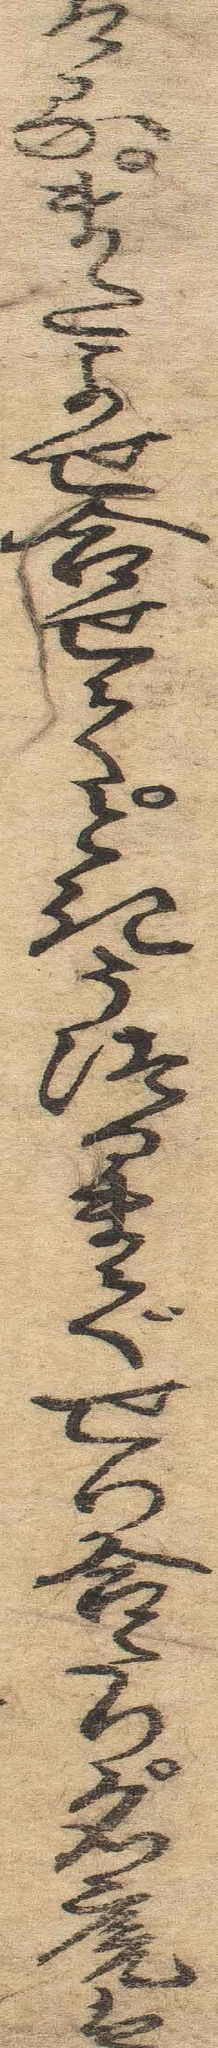ける。またよせ合せて。ときうつりけるまでせり合たり。名虎も
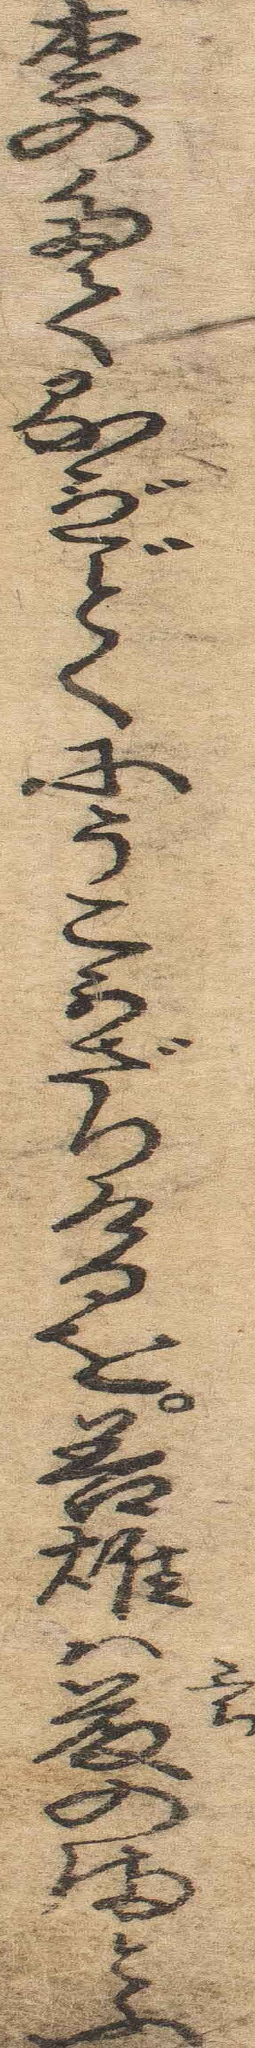松のたてるがごとくにうこかざりけるを。善雄は藤のまとふ
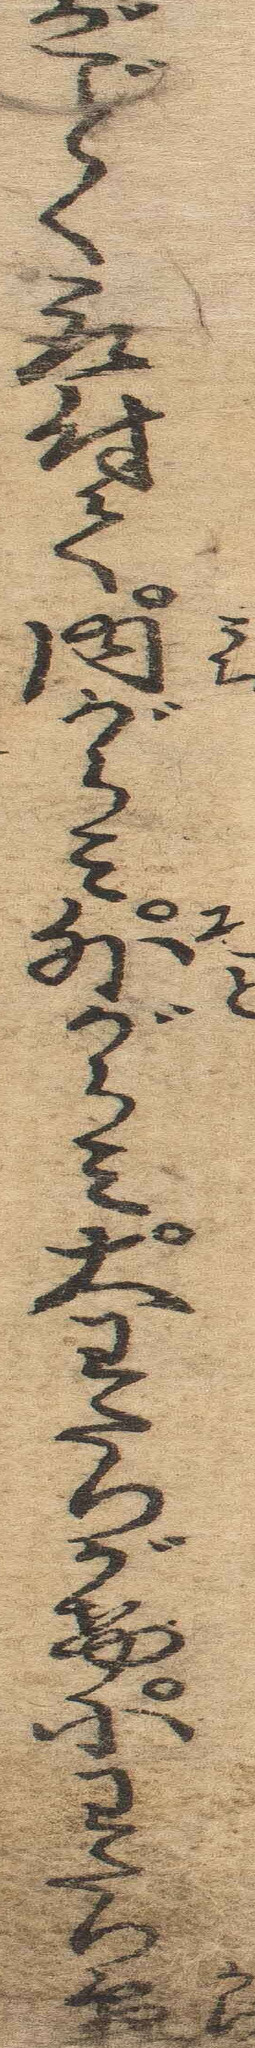ごとく取付て。内がらみ。外がらみ。大わたりがけ。小わたり懸
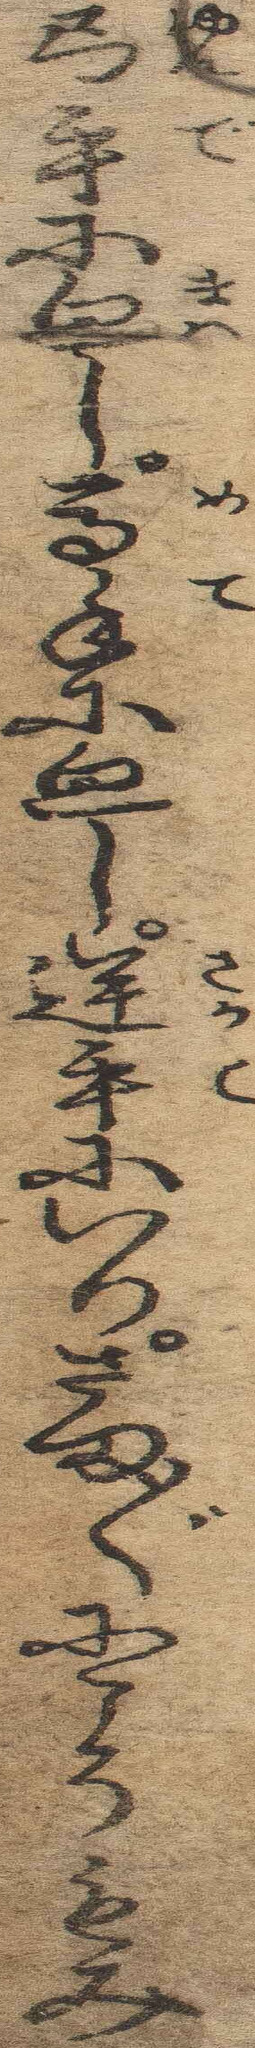弓手に廻し。馬手に廻し。逆手にいり。さま〴〵にこそもみ

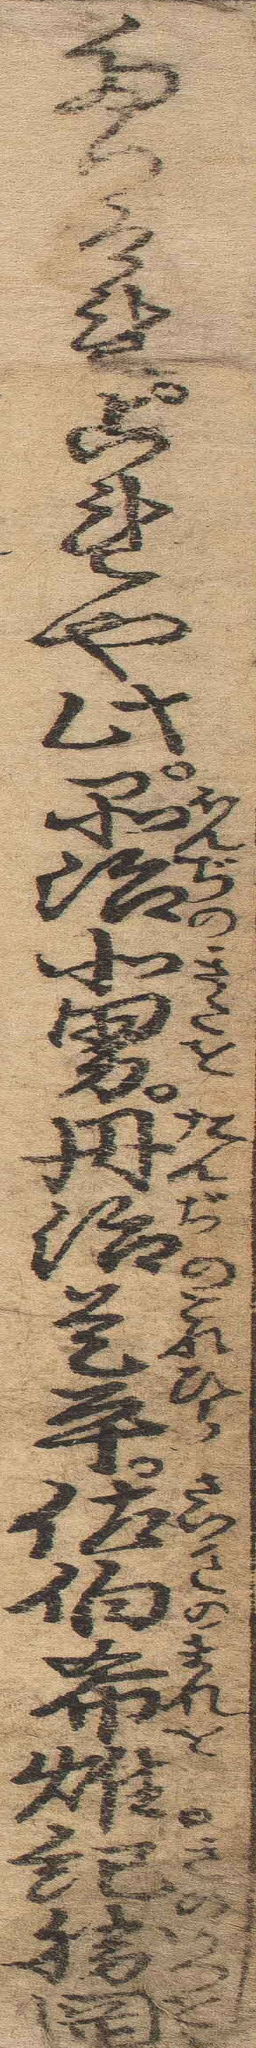たりけれ。これや此。品治北男。丹治是平。佐伯希雄紀勝岡
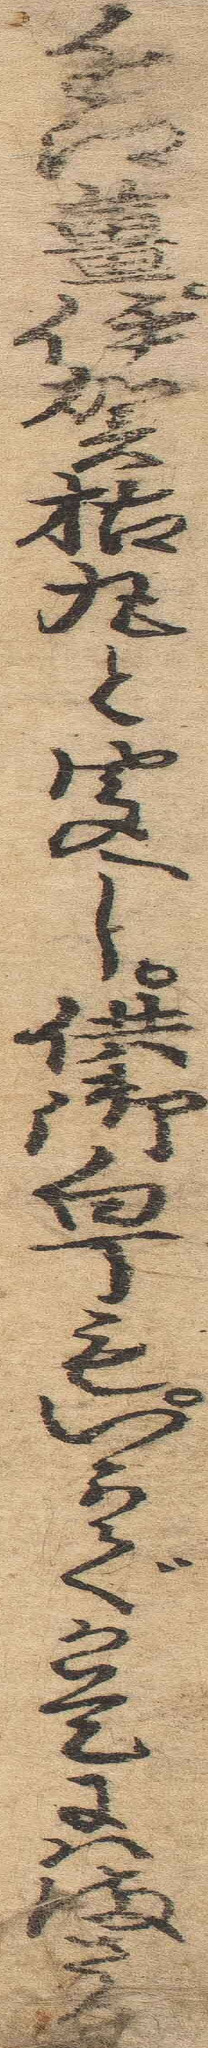近江薑。伊賀枯丸と聞へし。供御白丁も。いらでか是にはまさる
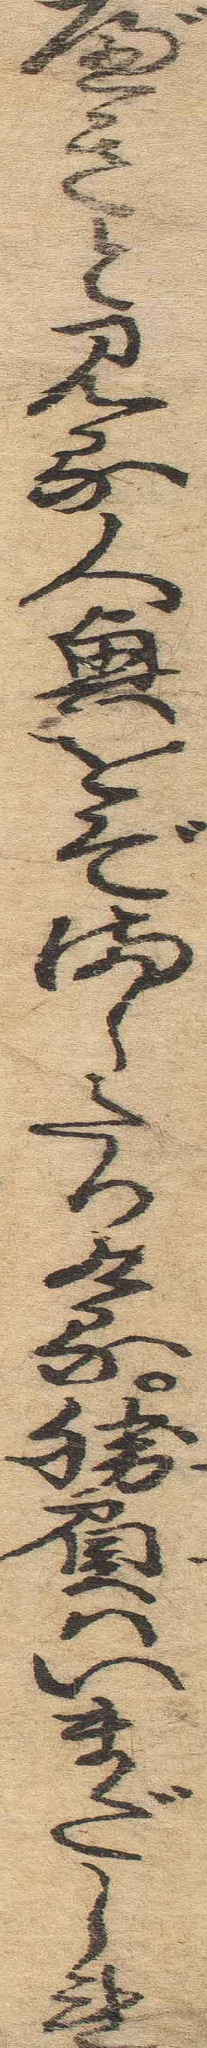べきと見る人興をぞましたりける。勝負はいまだしれ
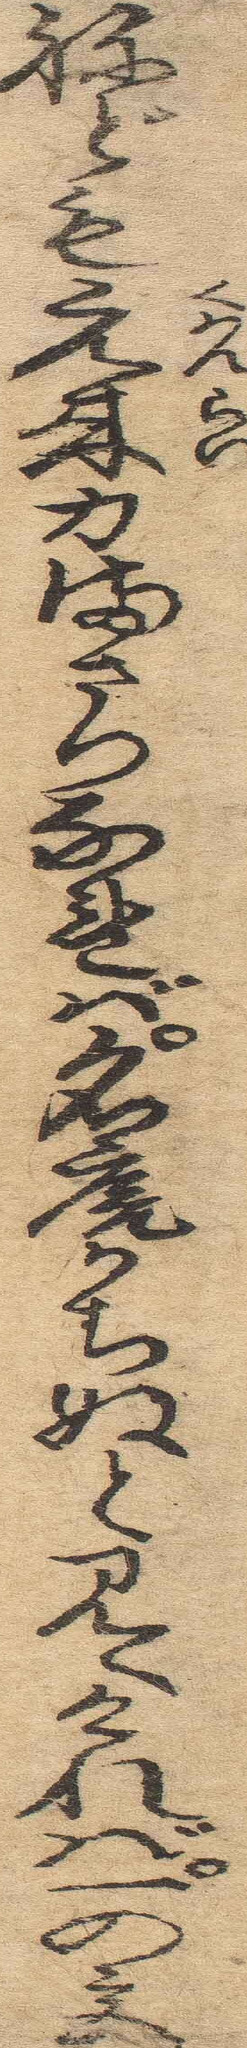ねども元来力まさりなれば。名虎かちぬと見へければ。一の宮
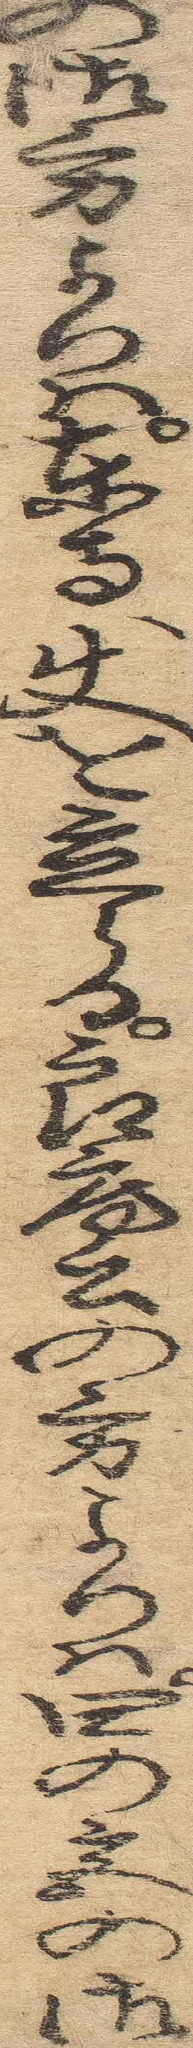の御方よりは。東寺へ使を立る。良房公の方よりは四の宮の御
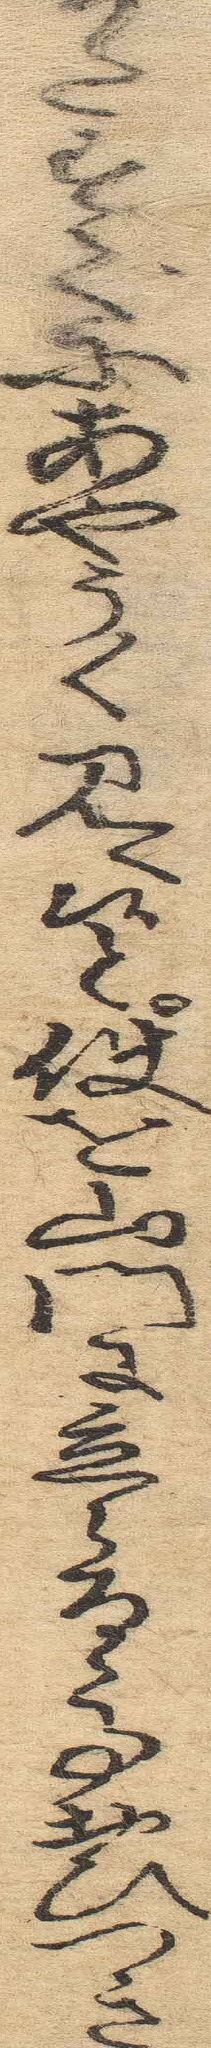かたすでにあやうく見へ候と。使を山門に立らる事おひつき
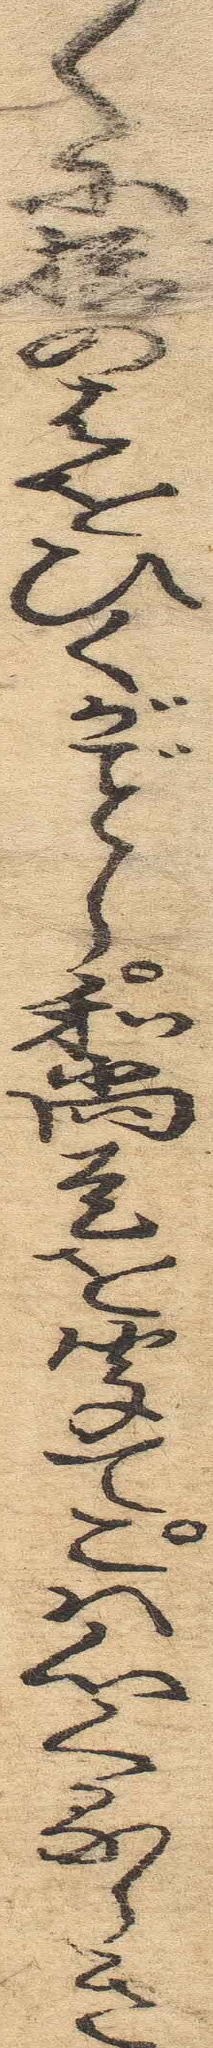〳〵に櫛のはをひくがごとし。和尚是を聞て。こは心くるしき
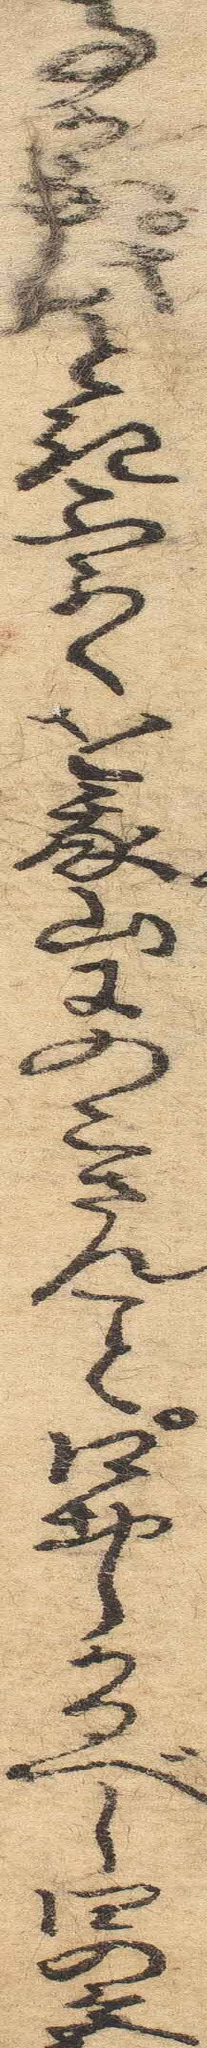事かな。此ときふかくを我山にのこさんこと。口おしかるべし四の宮
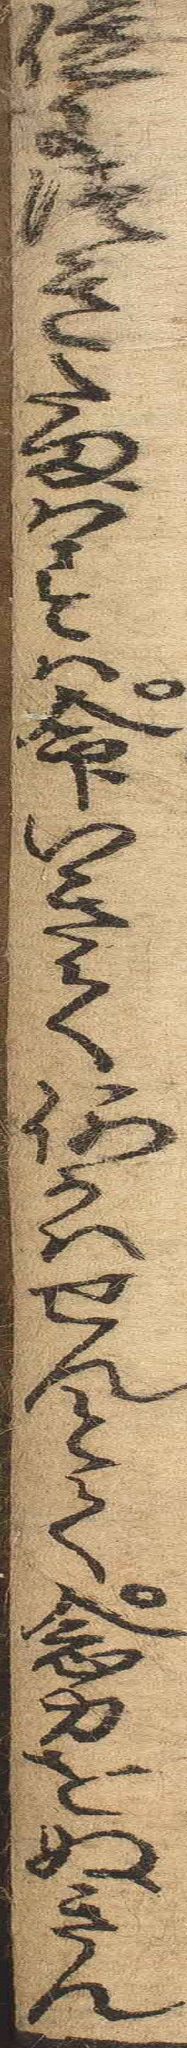位につきたまはんとは。命いきて何かはせんとて。念力をぬきん
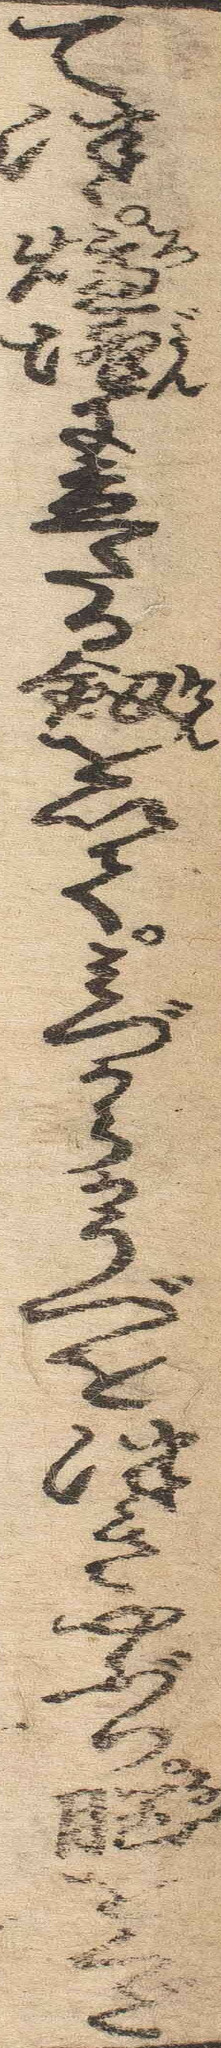てつゝ爐壇に置たる剱を以て。みづからかうべをつきやぶり。脳をくだ
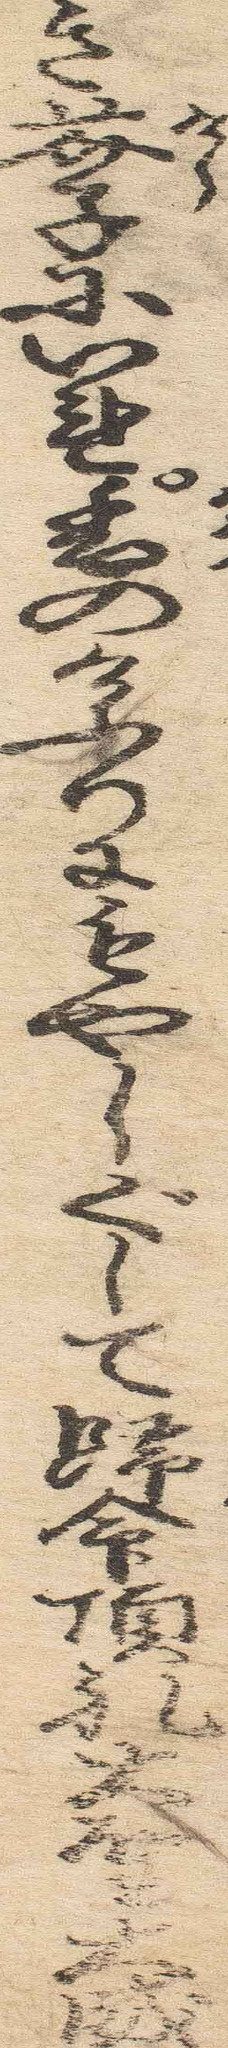き芥子にいれ。香のけふりにもやしぐして帰命頂礼大聖大威
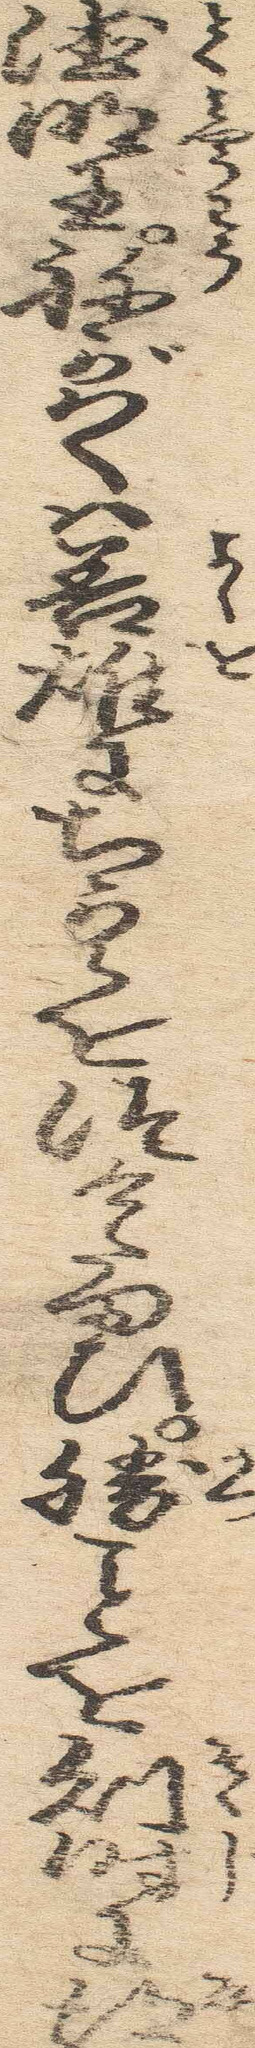徳明王。ねがはくば善雄にちからをつけたまひ。勝ことを即時に得
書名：古今相撲大全
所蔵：東京学芸大学附属図書館 国文学研究資料館
